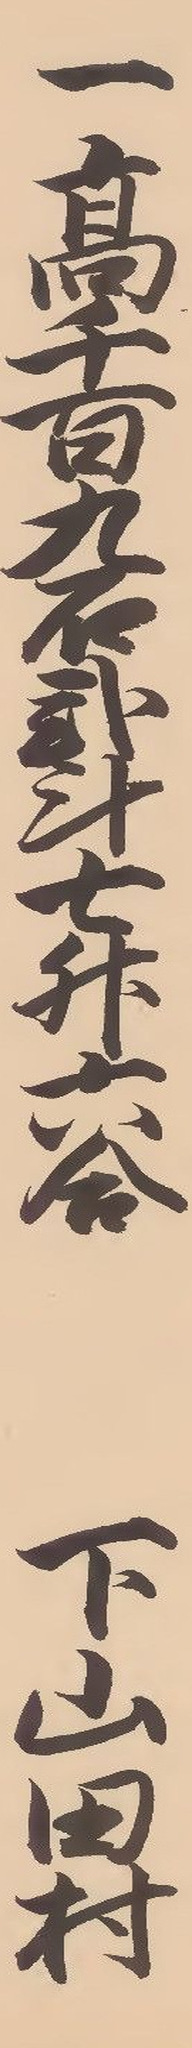一高千百九石弐斗七升六合下山田村
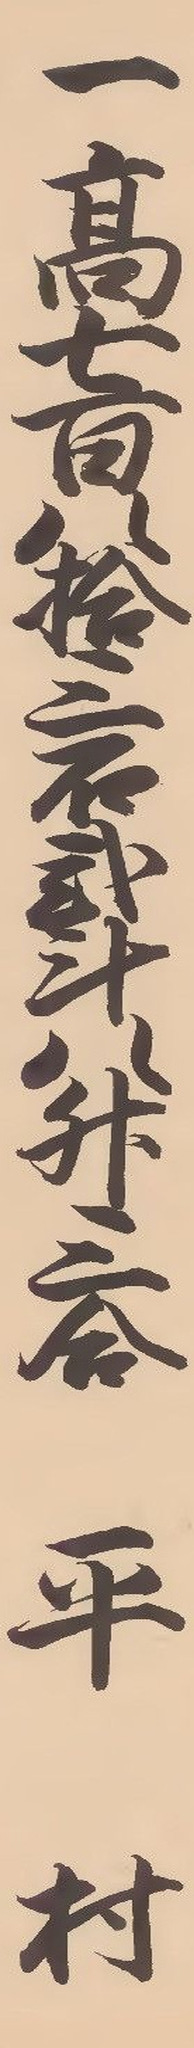一高七百八拾三石弐斗八升三合平村

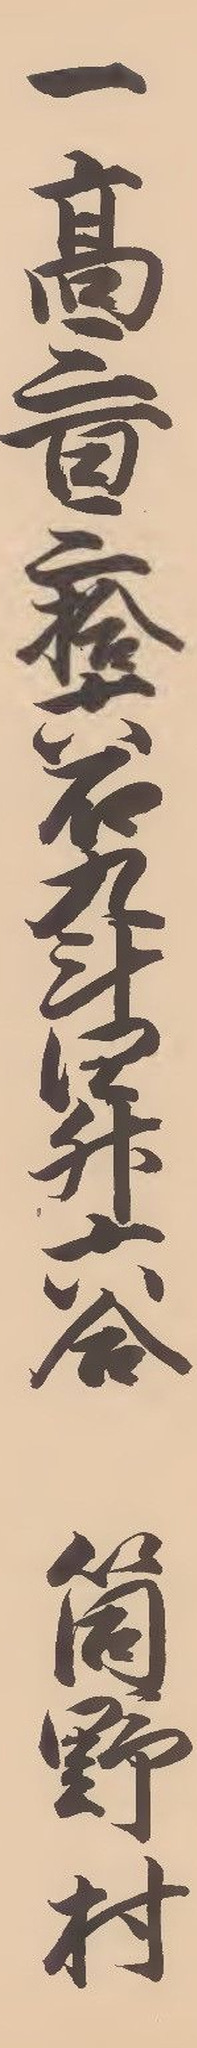一高三百三拾六石九斗四升六合筒野村
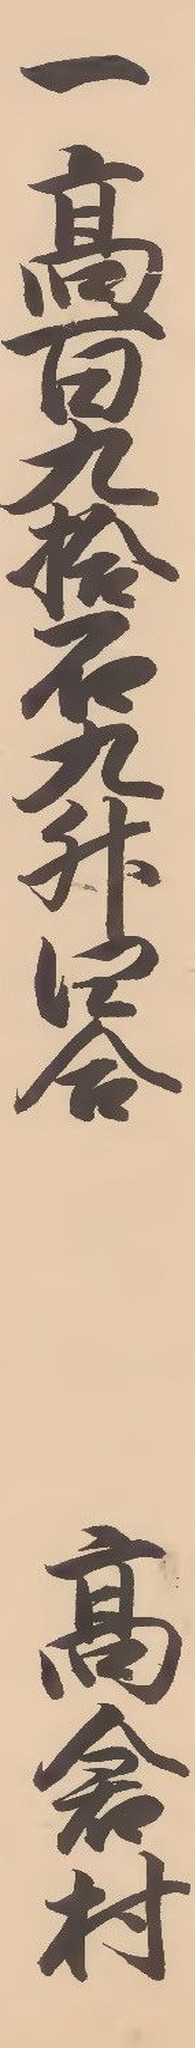一高百九拾石九升四合高倉村
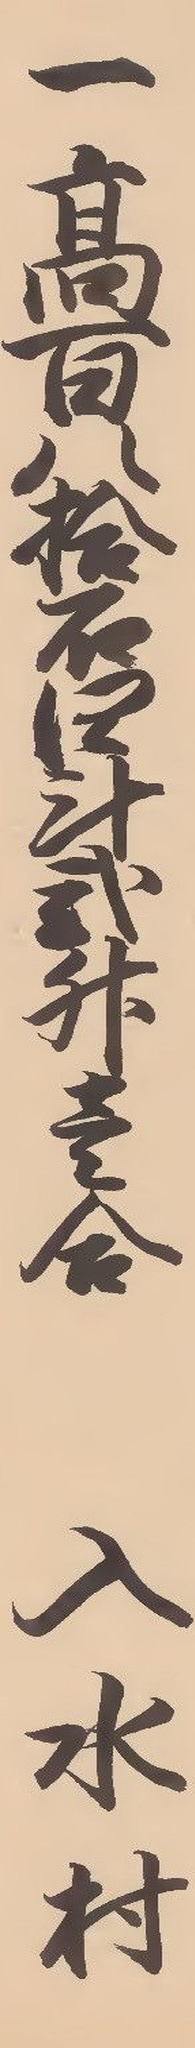一高百八拾石四斗弐升壱合入水村
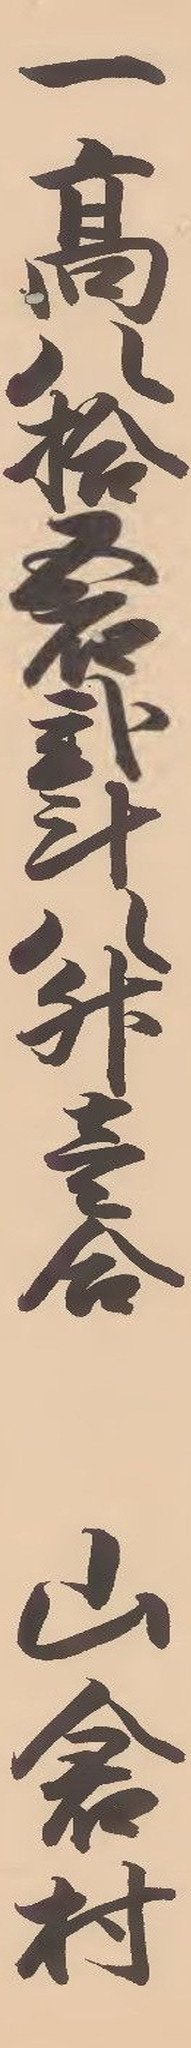一高八拾五石弐斗八升壱合山倉村
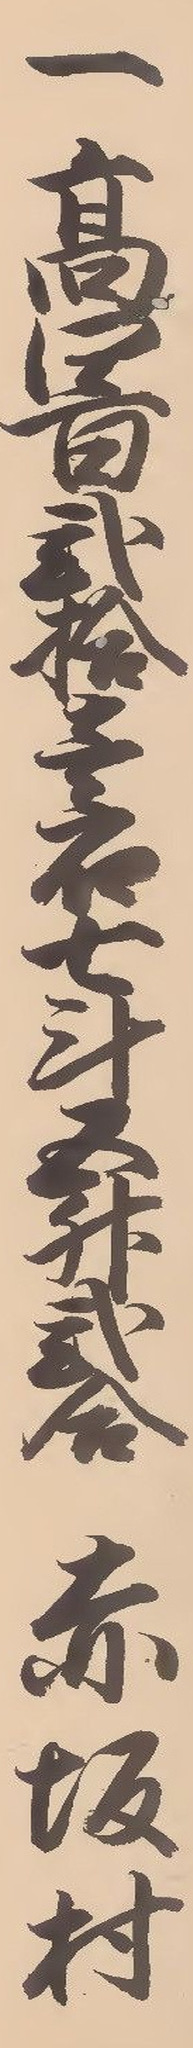一高四百弐拾壱石七斗五升弐合赤坂村
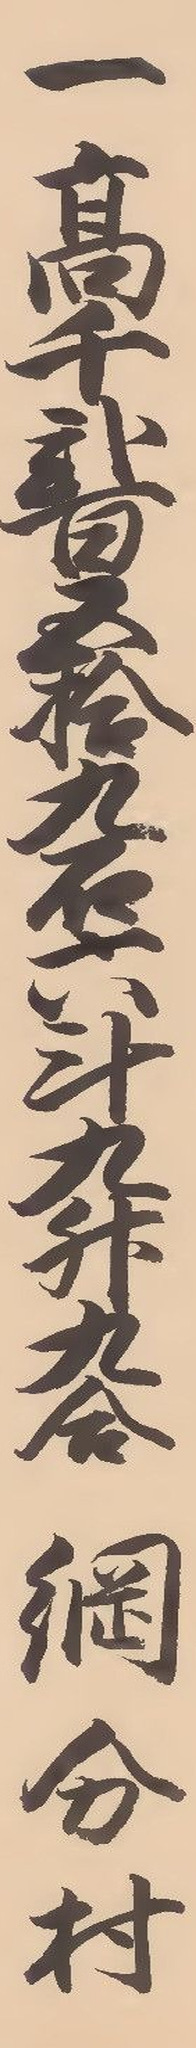一高千弐百五拾九石六斗九升九合綱分村
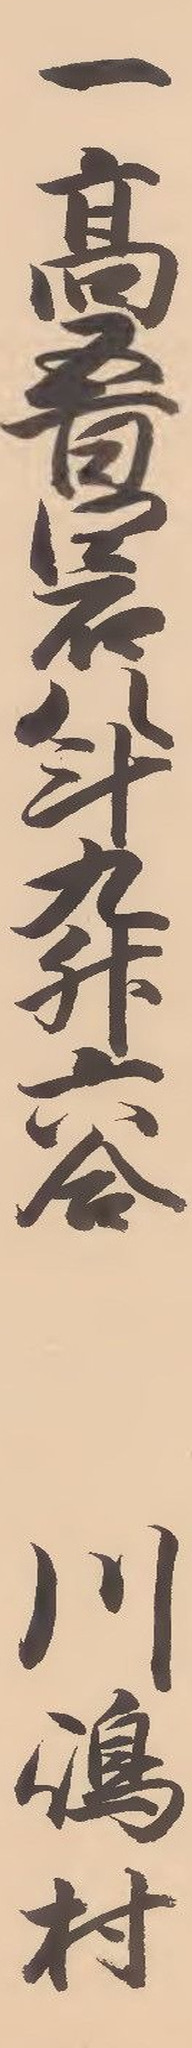一高五百四石八斗九升六合川島村
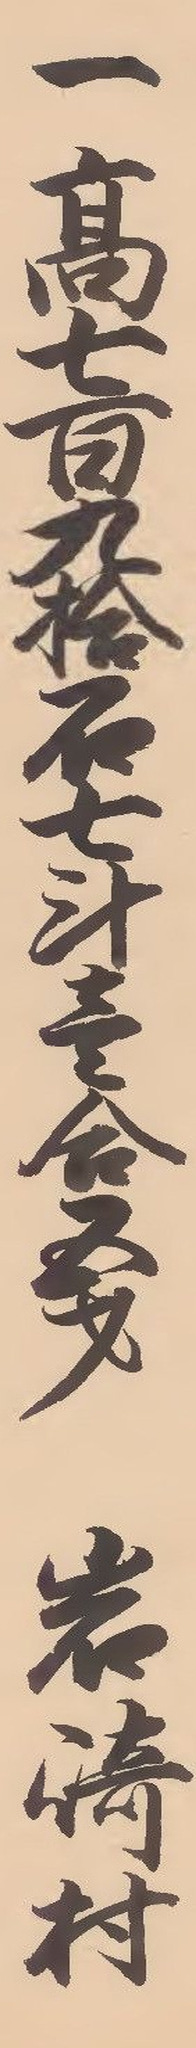一高七百九拾石七斗壱合五才岩崎村

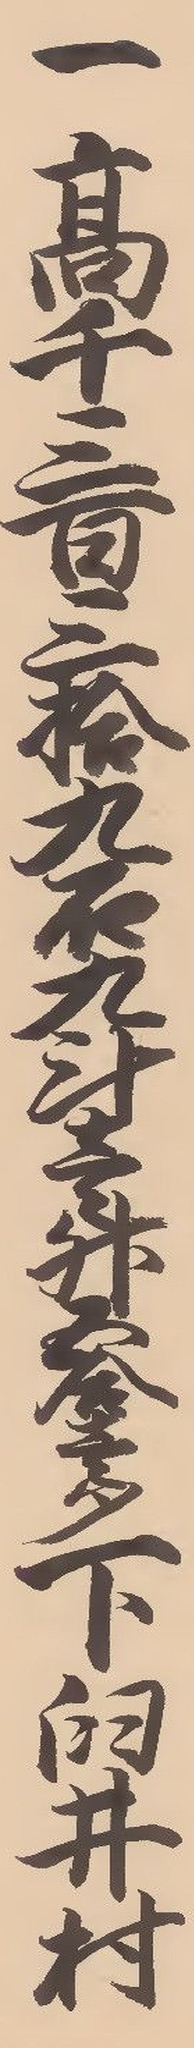一高千三百三拾九石九斗壱升五合壱勺下臼井村
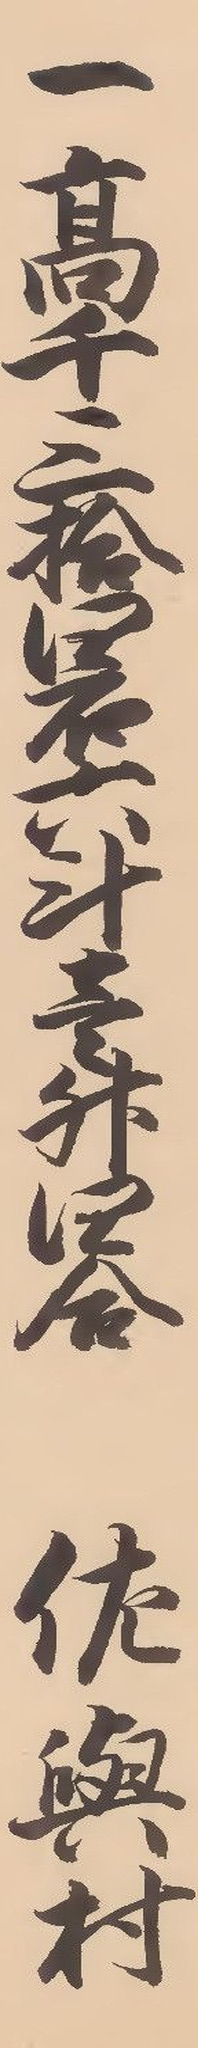一高千三拾四石六斗壱升四合佐与村
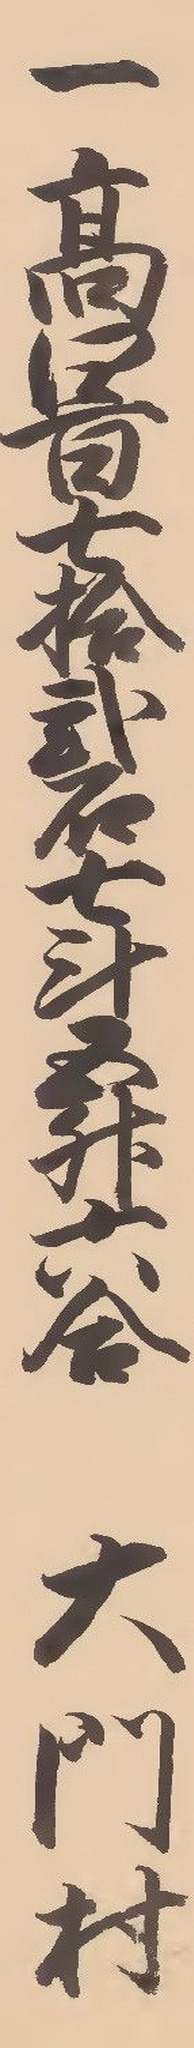一高四百七拾弐石七斗五升六合大門村
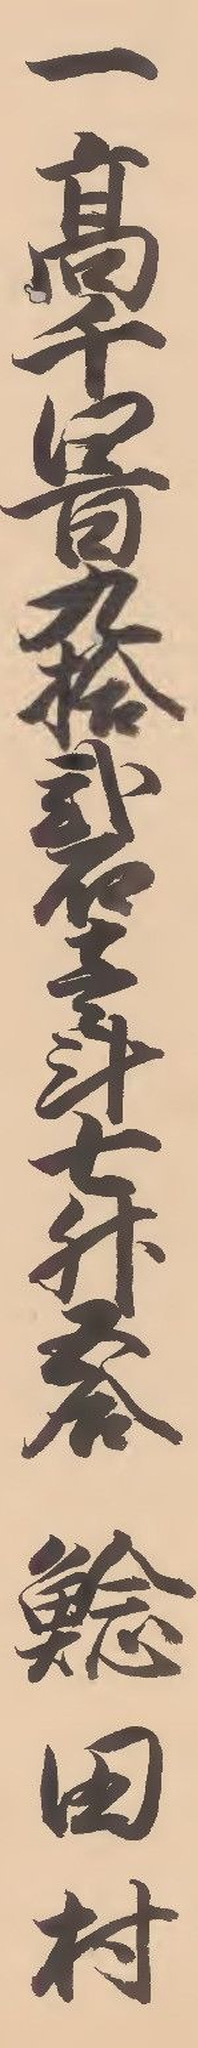一高千四百九拾弐石壱斗七升五合鯰田村
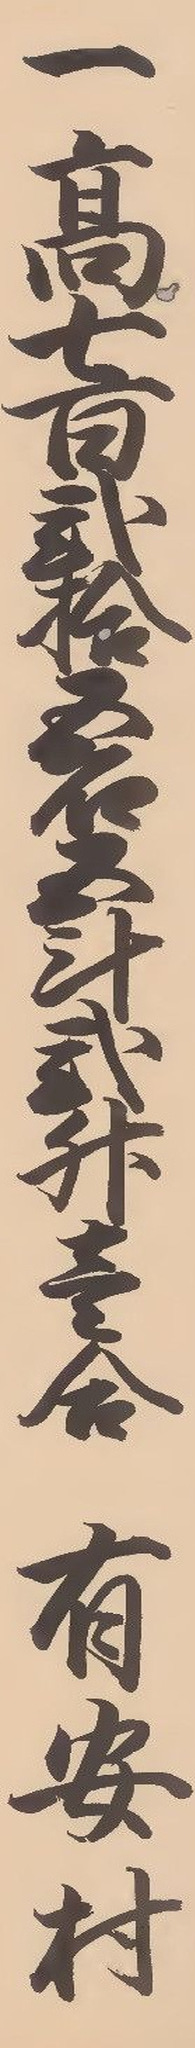一高七百弐拾五石五斗弐升壱合有安村
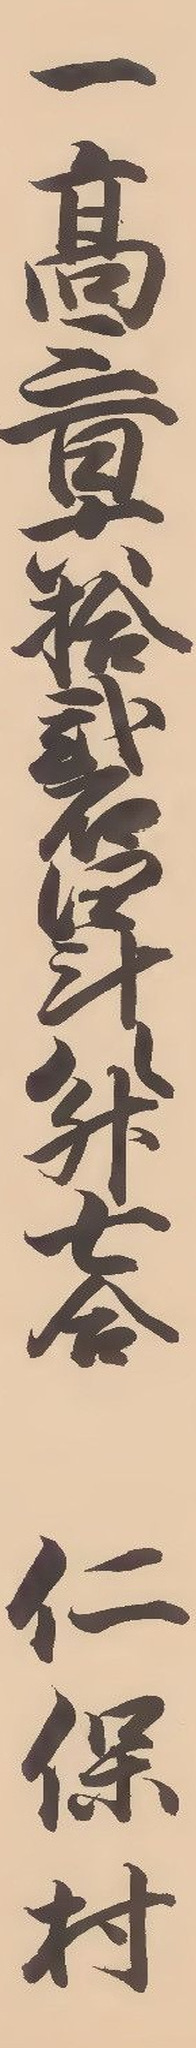一高三百六拾弐石四斗八升七合仁保村
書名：筑前国郷帳
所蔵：国立公文書館 National Archives of Japan
